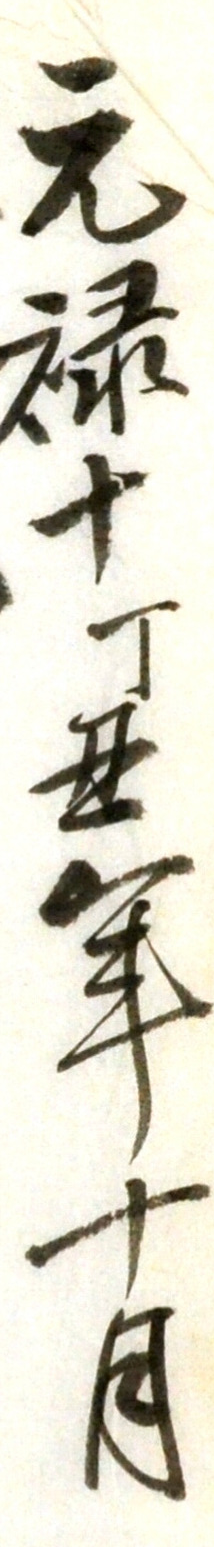元禄十丁丑年十月
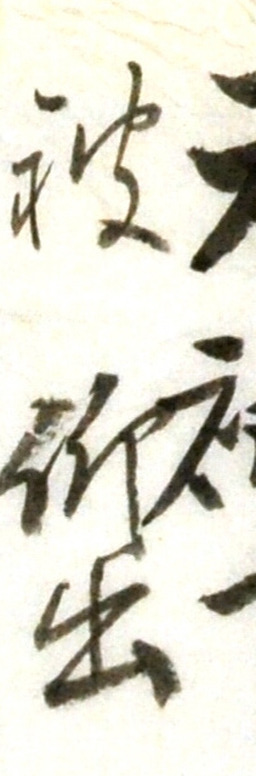被仰出
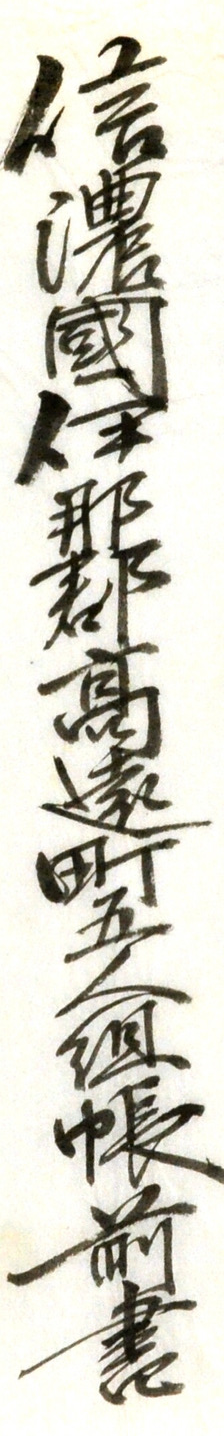信濃国伊那郡高遠町五人組帳前書

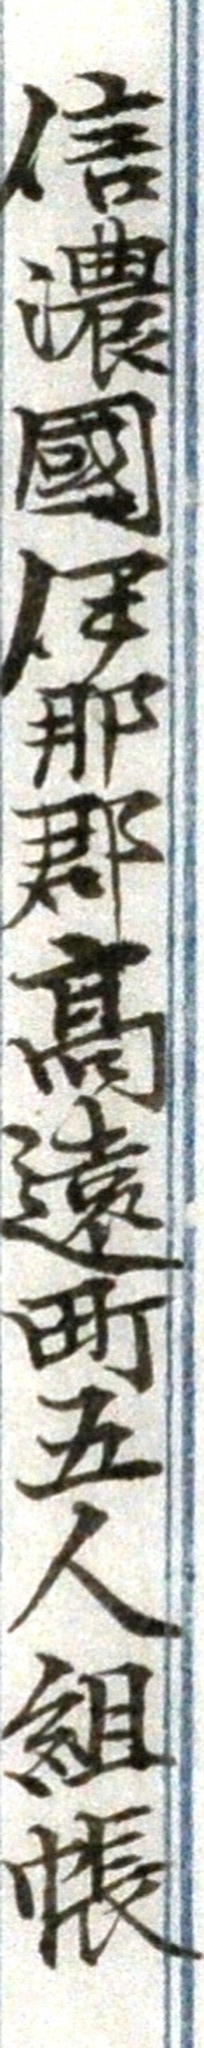信濃国伊那郡高遠町五人組帳
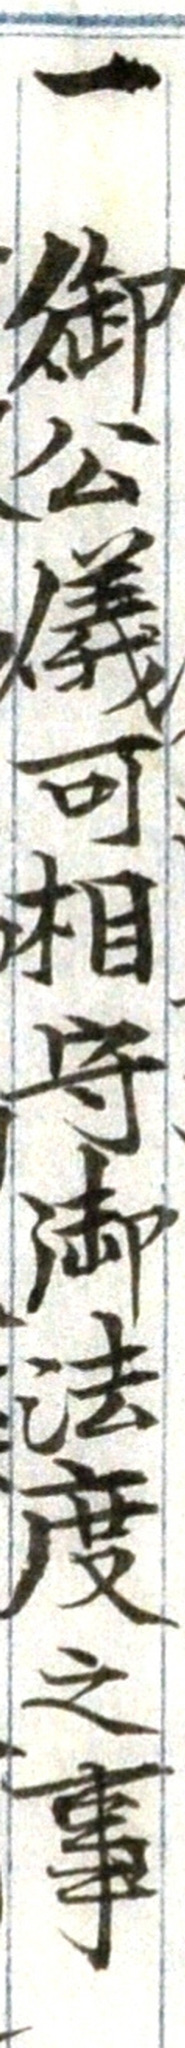一御公儀可相守御法度之事
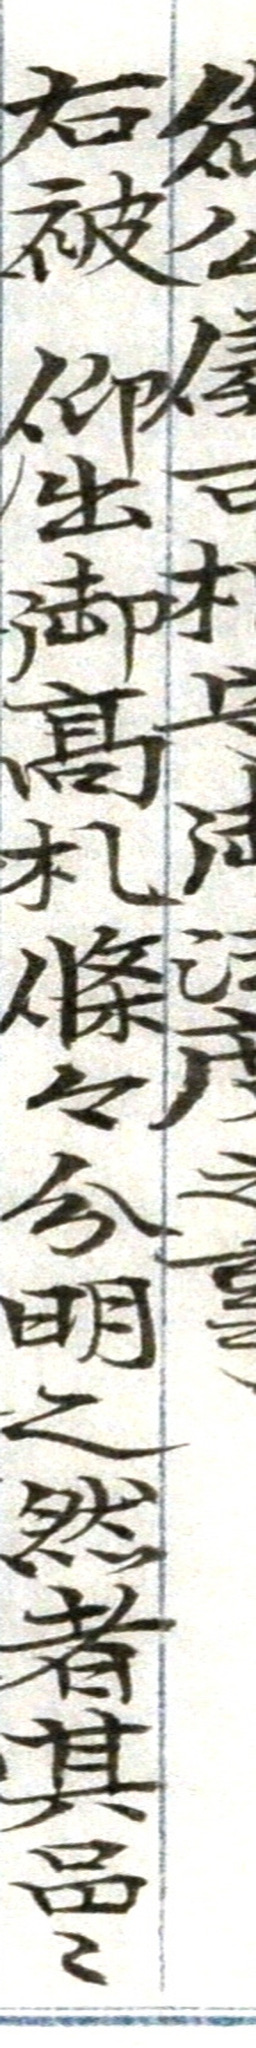右被仰出御高札條々分明也然者其品々
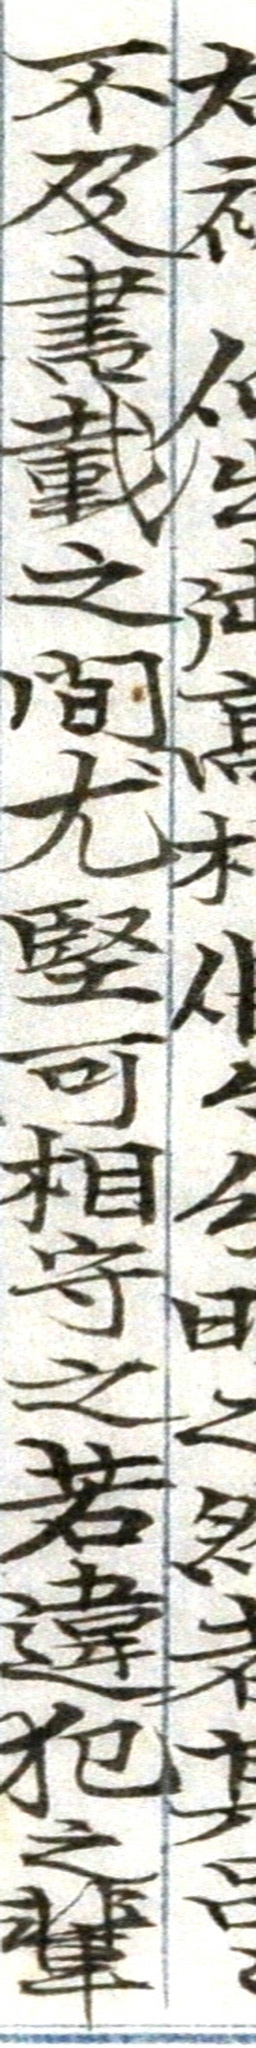不及書載之間尤堅可相守也若違犯之輩
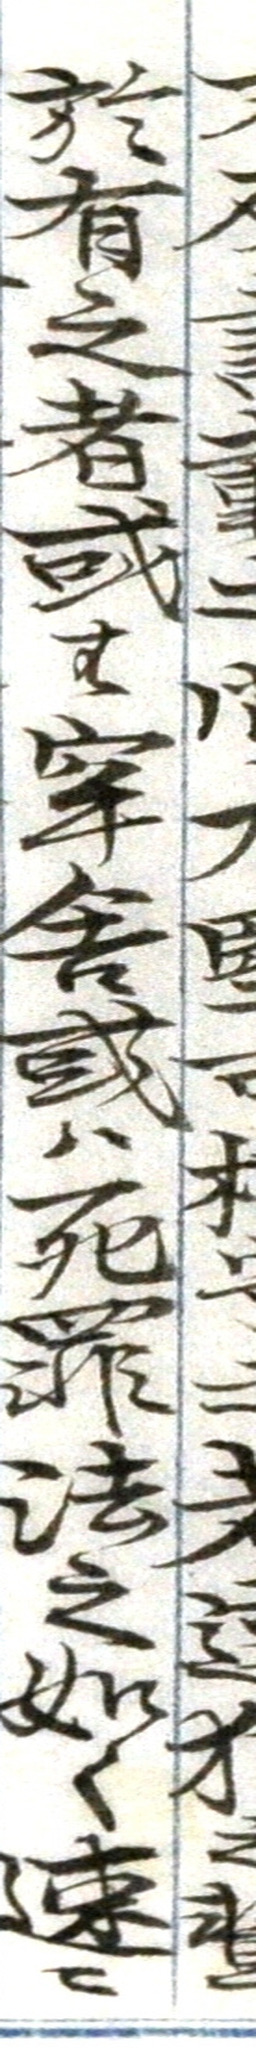於有之者或は牢舎或ハ死罪法之如く速ニ
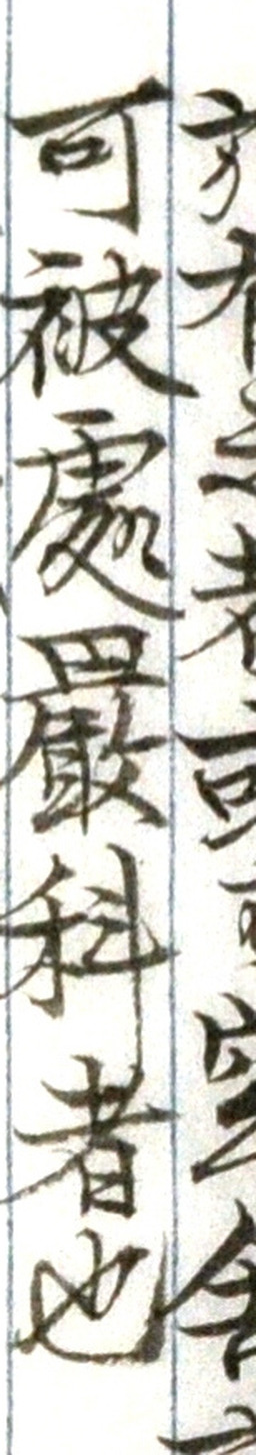可被処厳科者也
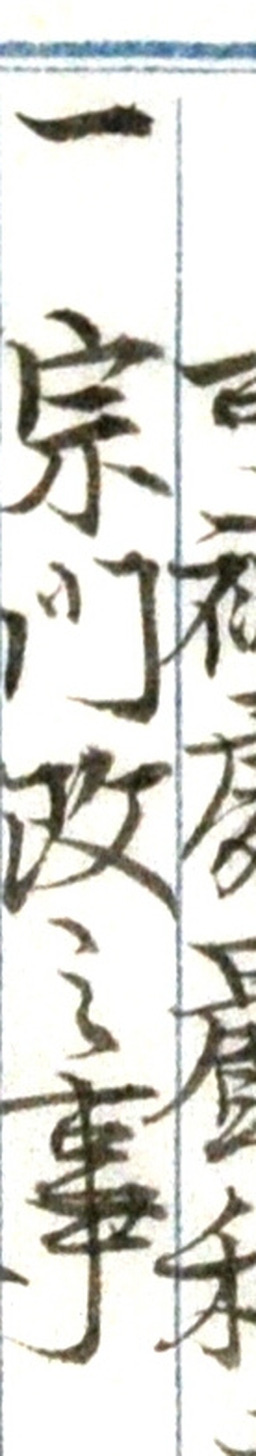一宗門改之事
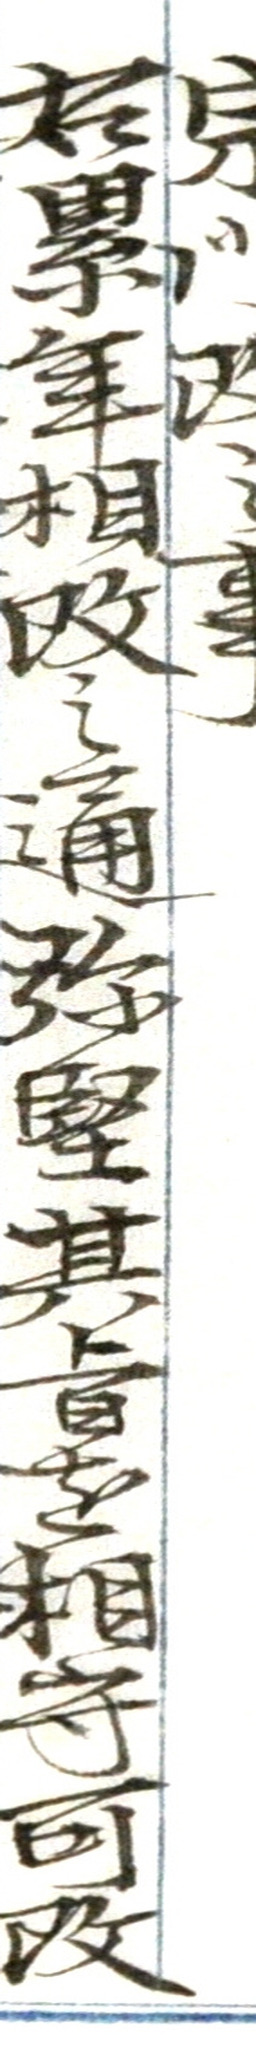右累年相改之通弥堅其旨を相守可改
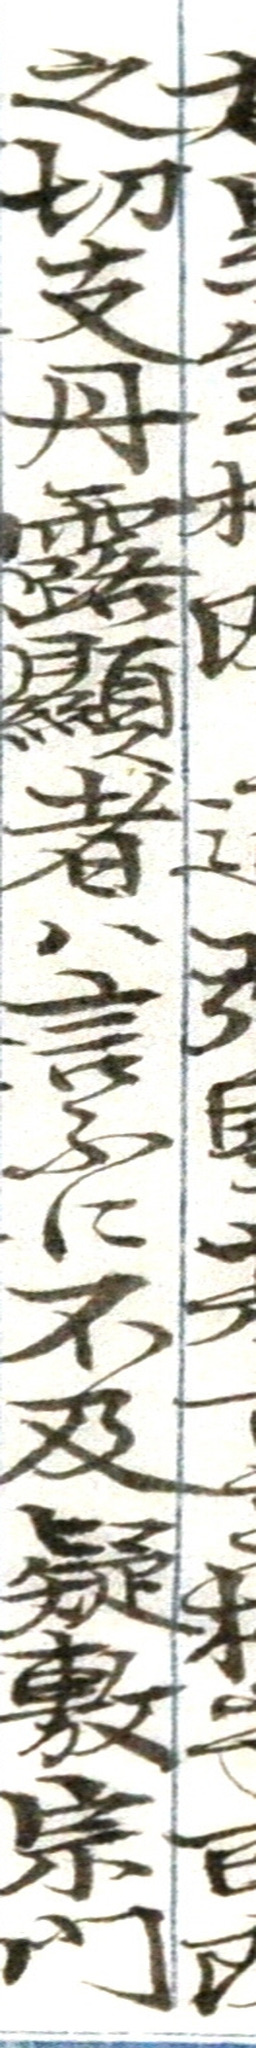也切支丹露顕者ハ言ふに不及疑敷宗門
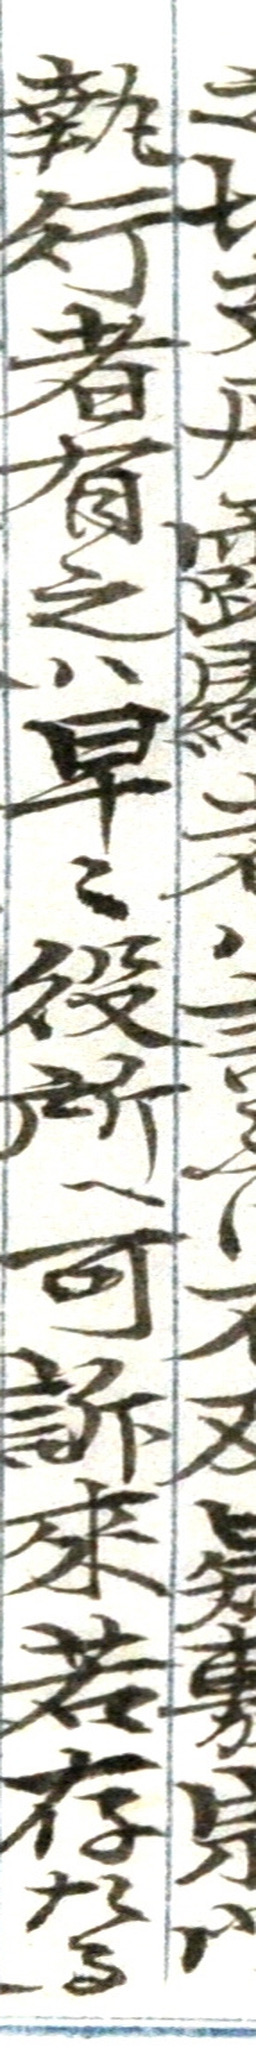執行者有之ハ早々役所へ可訴来若存たる
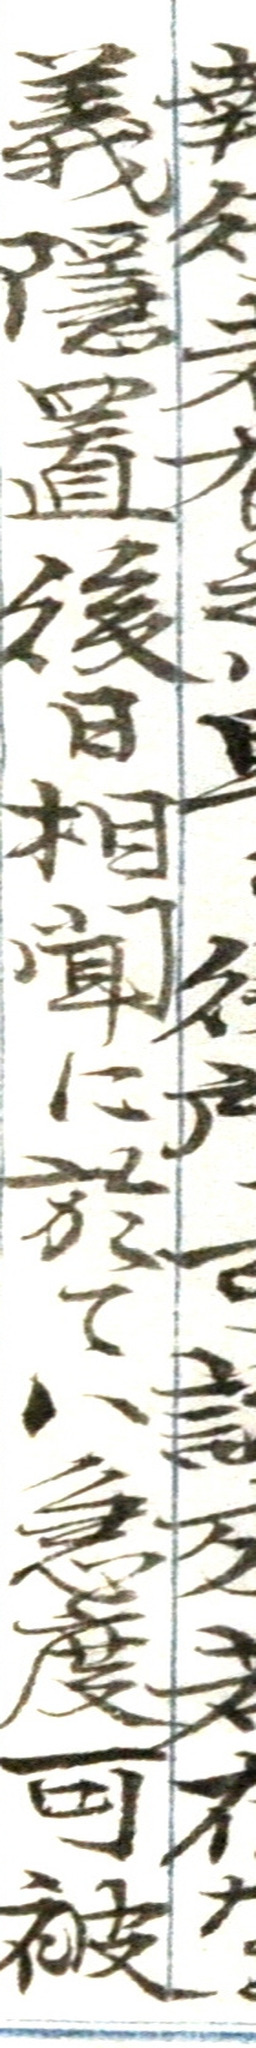義隠置後日相聞に於てハ急度可被
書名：信濃国伊那郡高遠町五人組帳前書（写）
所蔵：伊那市立高遠町図書館・合同会社AMANE
